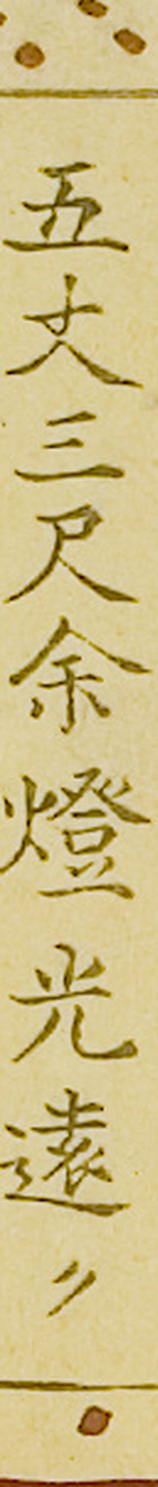五丈三尺余燈光遠ク
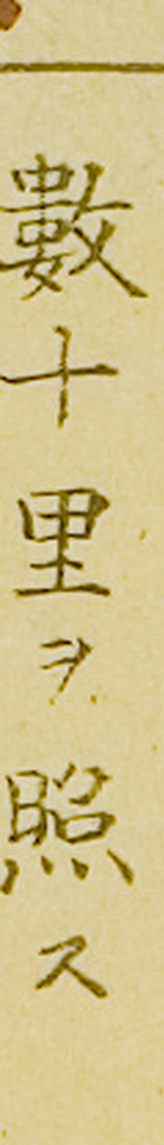数十里ヲ照ス
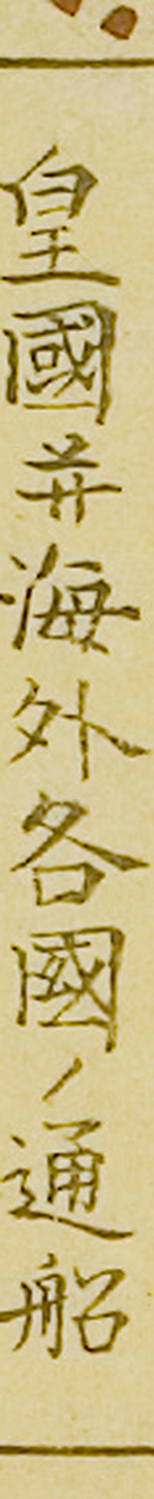皇国并海外各国ノ通船
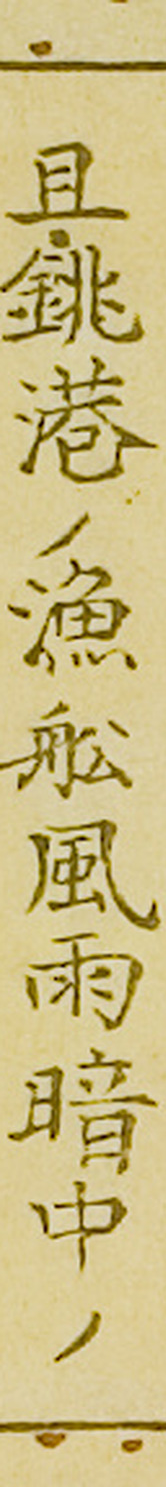且銚港ノ漁船風雨暗中ノ
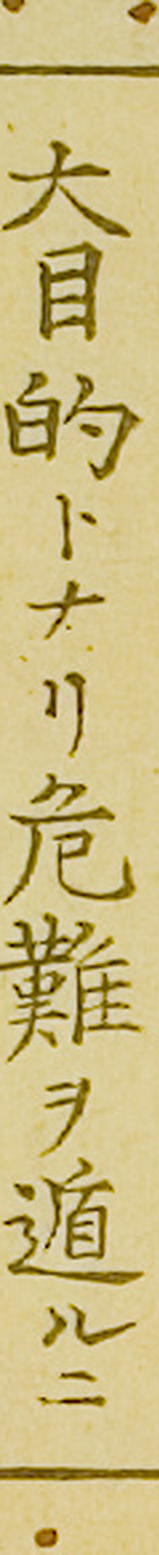大目的トナリ危難ヲ遁ルニ
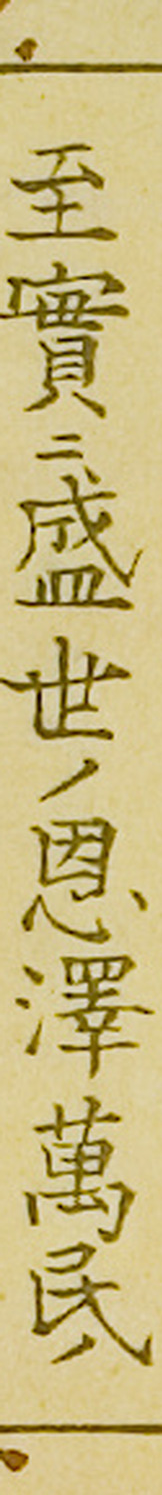至実に盛世ノ恩沢万民ノ
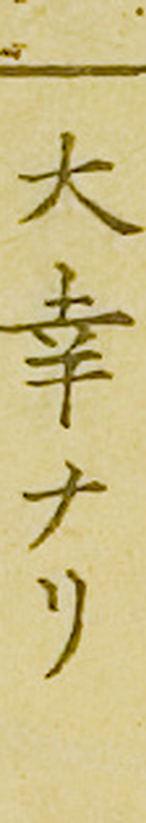大幸ナリ
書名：総州銚子港燈台略図
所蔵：東京大学総合図書館 General Library in the University of Tokyo, JAPAN
